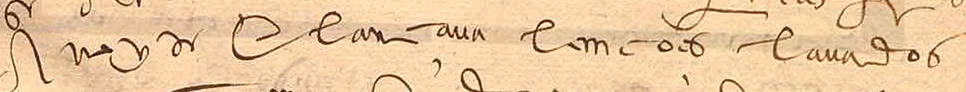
A noyte e lançaua lemçoēs lauados
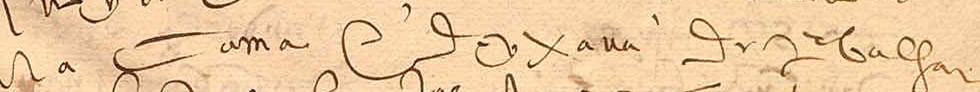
Na Cama e deyxaua de trbalhar
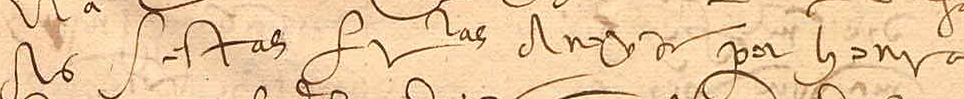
As sestas frras A noyte por honra
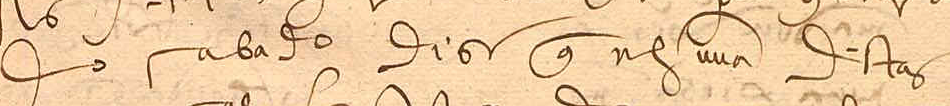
do sabado dise q̄ nhūua destas
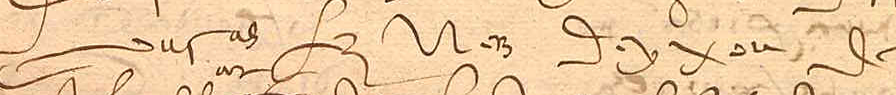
Cousas fez Nem deyxou de
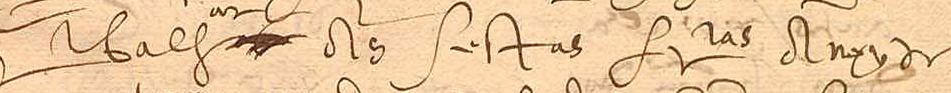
trbalhar As sestas frras A noyte
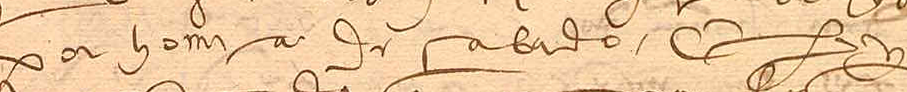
por homra de sabado / E foy
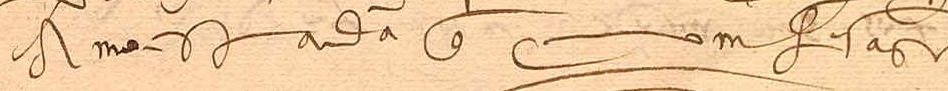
Amoestada q̄ Comfesase
